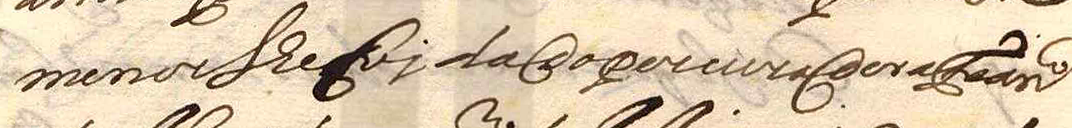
menor lhe foj dado por curador a Franco
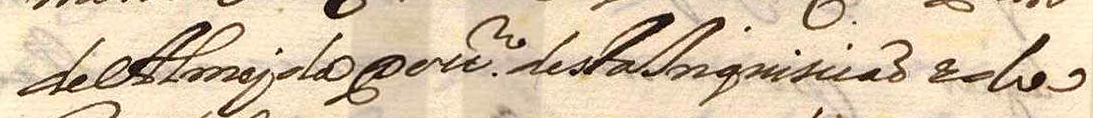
de Almejda portro desta Inquisiçaõ E do
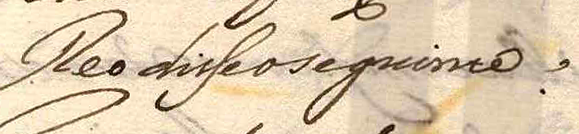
Reo disse o seguinte.
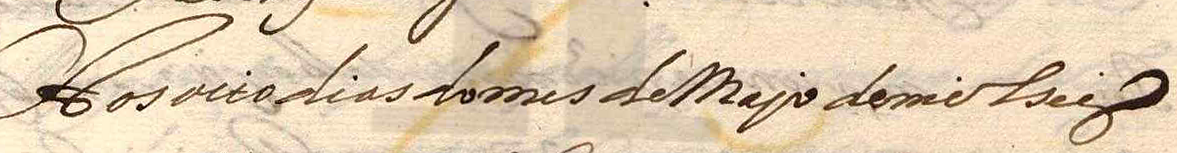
Aos oito dias do mes de Majo de mil seis
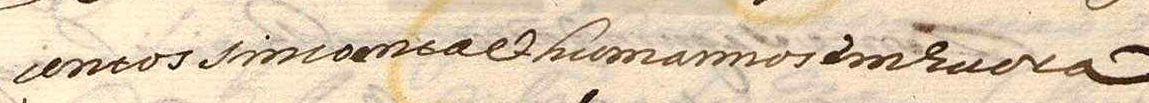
centos sincoenta e hum annos em Euora
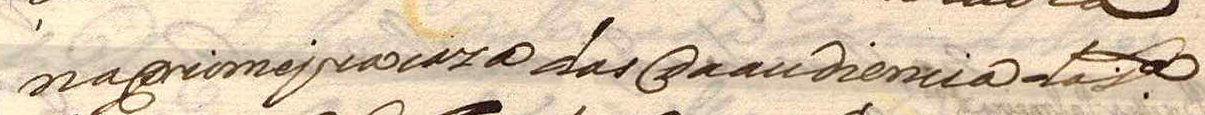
na primejra caza das da audiencia da sta
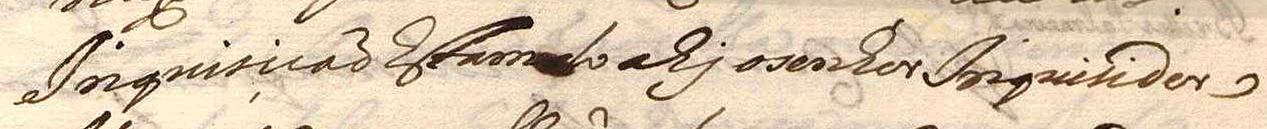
Inquisiçaõ Estando ahj o senhor Inquisidor
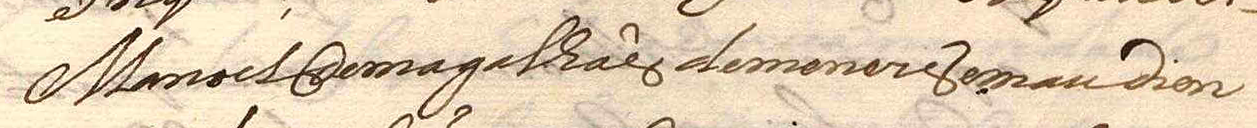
Manoel de magalhaẽs de menezes em audien
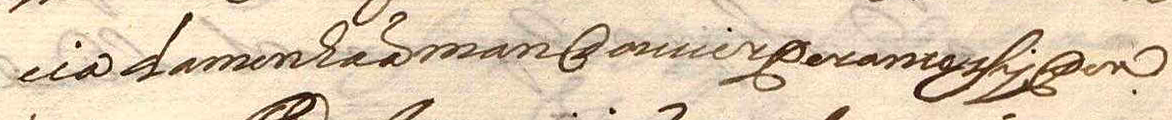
cia da menhaā mandou uir perante sj por
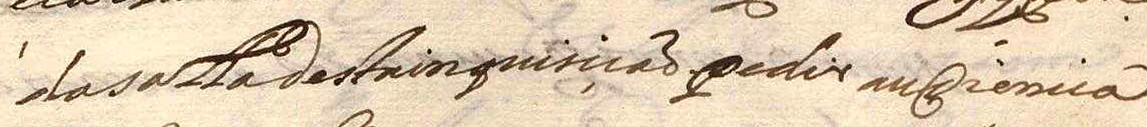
da salla desta inquisição pedir audiencia
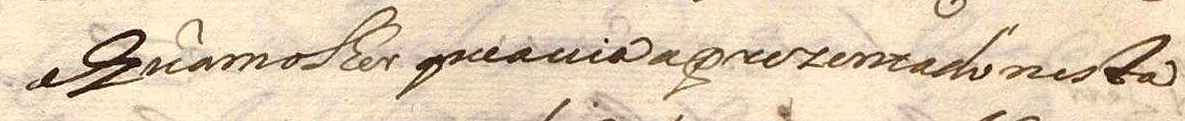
a huā molher que auia aprezentado nesta
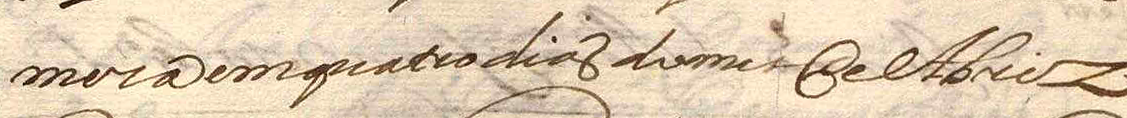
meza em quatro dias do mes de AbriL
